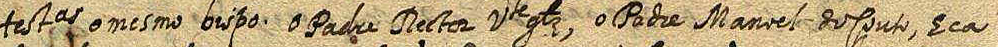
testas o mesmo bispo. O Padre Rector Vte gl̄z, o Padre Manoel do Couto, E ca
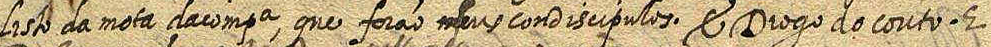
listo da mota da compa, que foraõ meus condiscipulos. & Diogo do couto. E
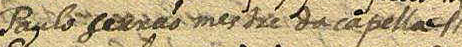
Paulo serraõ mestre da capella//
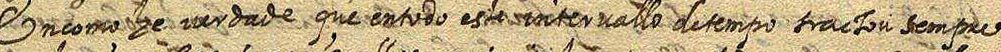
En como he uerdade que en todo este interuallo de tempo tractou sempre
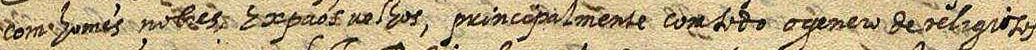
com homēs nobres E xpaõs uelhos, principalmente com todo o género de religiosos
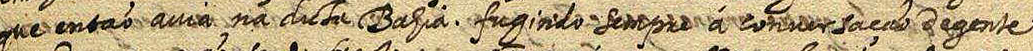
que entaõ auia na dicta Bahia . fugindo sempre á conuersaçaõ de gente
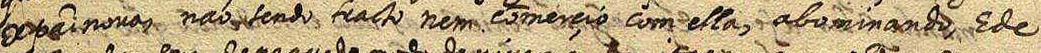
xpā noua, naõ tendo tracto nem comerçio com ella, abominando, E de
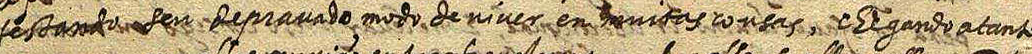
testanto seu deprauado modo de uiuer en muitas couas, chegando a tanto
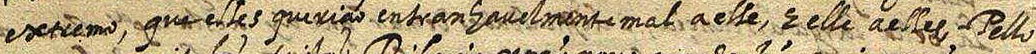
extremo, que elle queriaõ entranhauelmente mal a elle, E elle a elles Pello
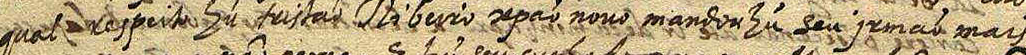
qual respeito hū tristaõ Ribeio xpaõ nouo mandou hū seu jrmaõ mais
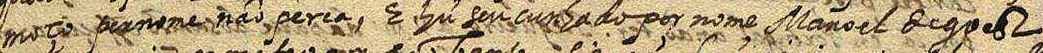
moço per nome naõ perca, E hū seu cunhado por nome Manoel de goes
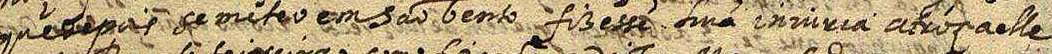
que depois se meteo em saõ bento fizessē huā iniuria atróz a elle
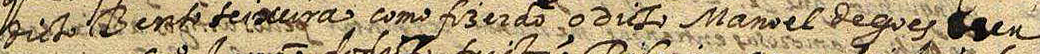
dito Bento teixeira como fizeraõ o dicto Manoel de Goes e seu
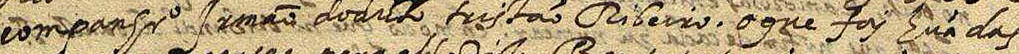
companhro Jrmaõ do dicto tristaõ Ribeiro. o que foy huā das
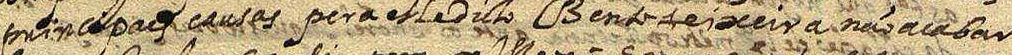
principaes causas pera elle dicto Bento teixeira a naõ acabar
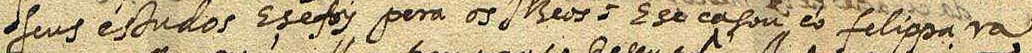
seus estudos E se foy pera os Jlheos : E se casou cō felippa ra
